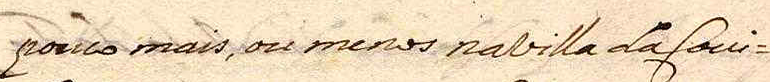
pouco mais, ou menos na villa da Coui
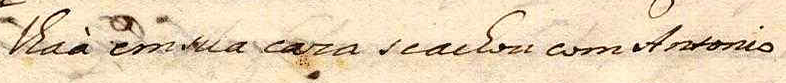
lhaã em sua caza se achou com Antonio
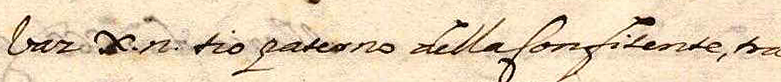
Vaz x. n. tio paterno della Confitente, tra
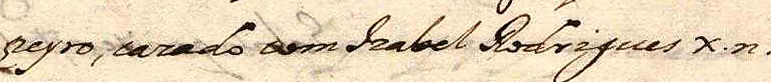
peyro, cazado com Izabel Rodrigues x. n.
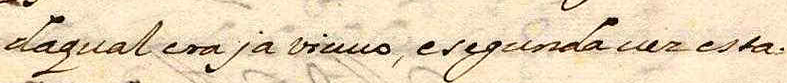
da qual era ja viuuo, e segunda uez esta
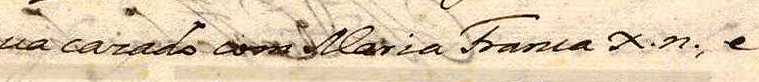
ua cazado com Maria Franca x. n., e
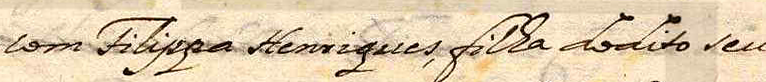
com Filippa Henriques, filha do dito seu
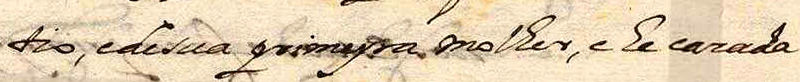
tio, e de sua primeyra molher, e he cazada
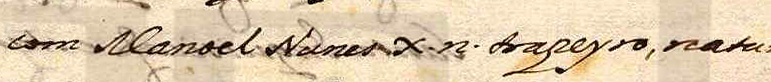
com Manoel Nunes x. n. trapeyro, natu
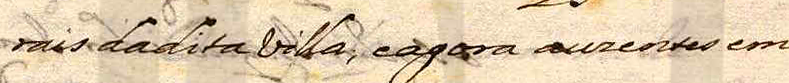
rais da dita villa, e agora auzentes em
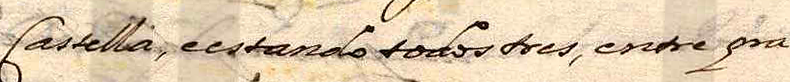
Castella, e estando todos tres, entre pra
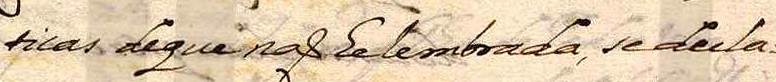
ticas de que naõ he lembrada, se decla
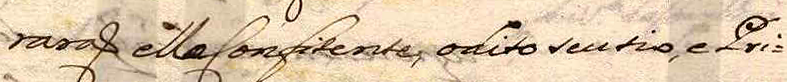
raraõ ella Confitente, o dito seu tio, e Pri
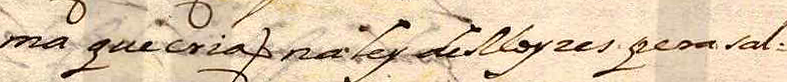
ma que criaõ na ley de Moyzes pera sal
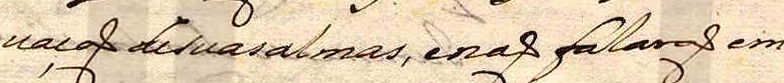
uaçaõ de suas almas, e naõ falaraõ em
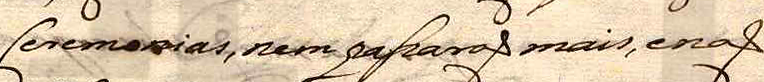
Ceremonias, nem passaraõ mais, e naõ
